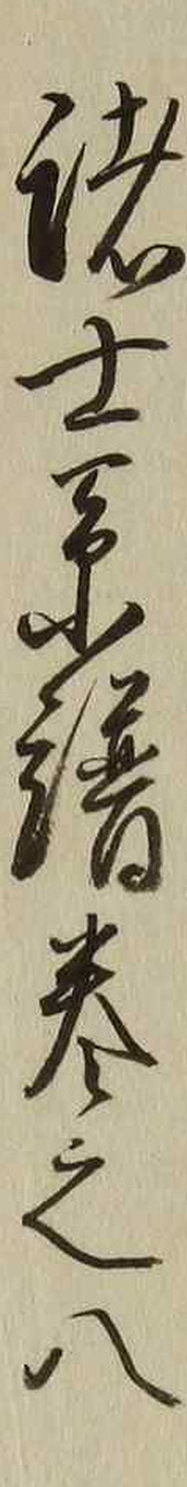諸氏系譜巻之八
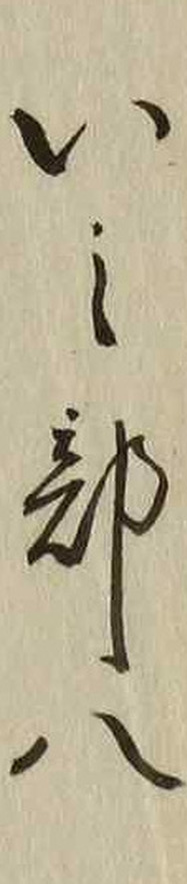い之部八
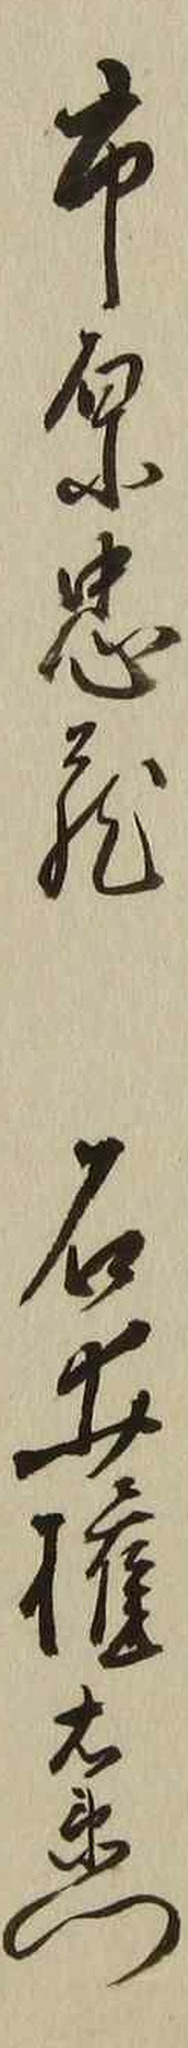市原忠蔵石井権右衛門
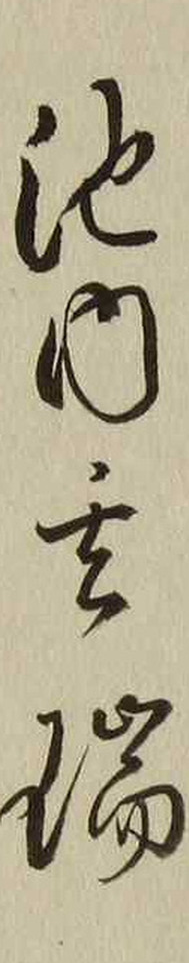池内玄瑞

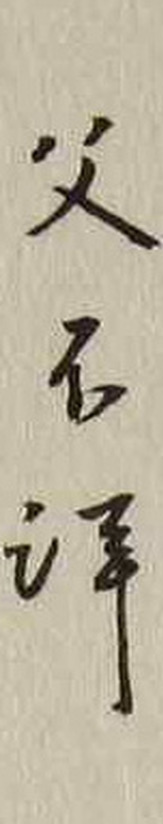父不詳
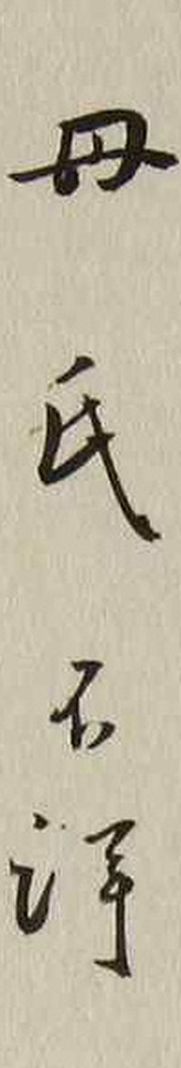母氏不詳
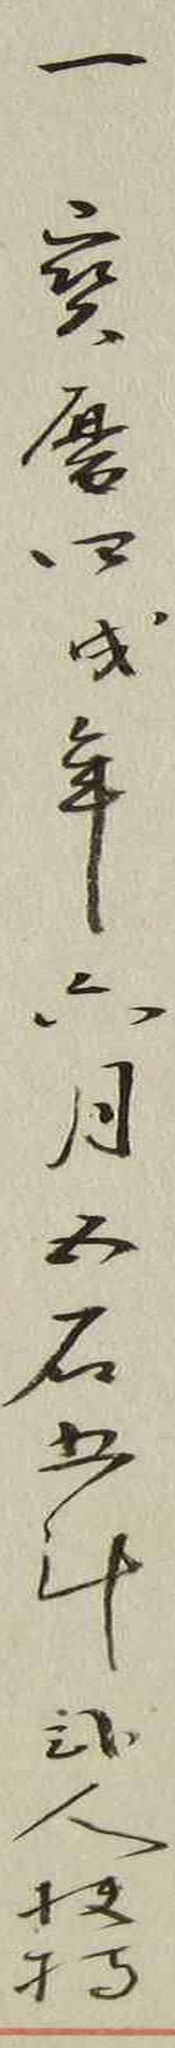一宝暦四戌年六月五石五斗弍人扶持
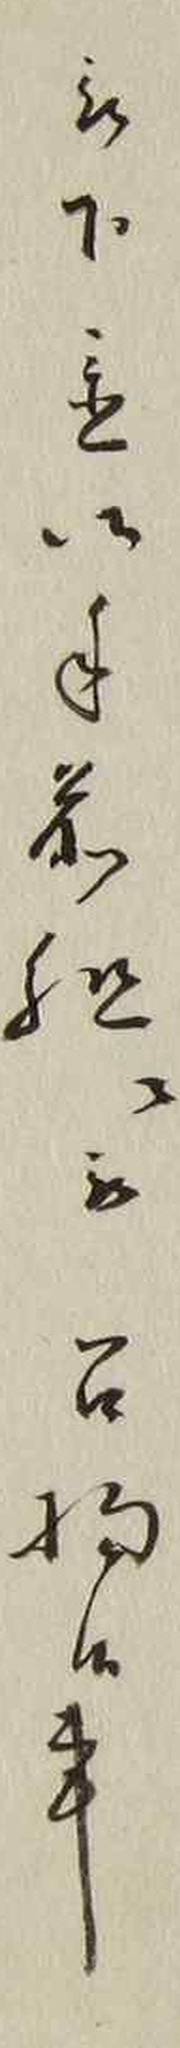被下置候手前組ニ被召抱候事
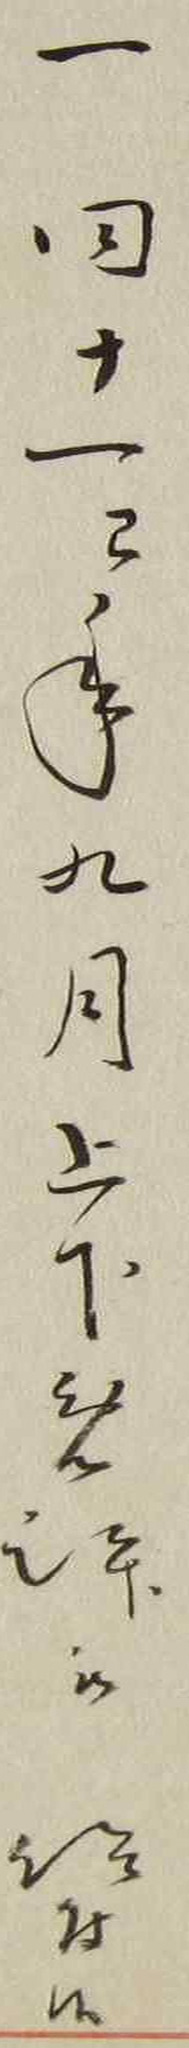一同十一巳年九月上下免許被仰付候

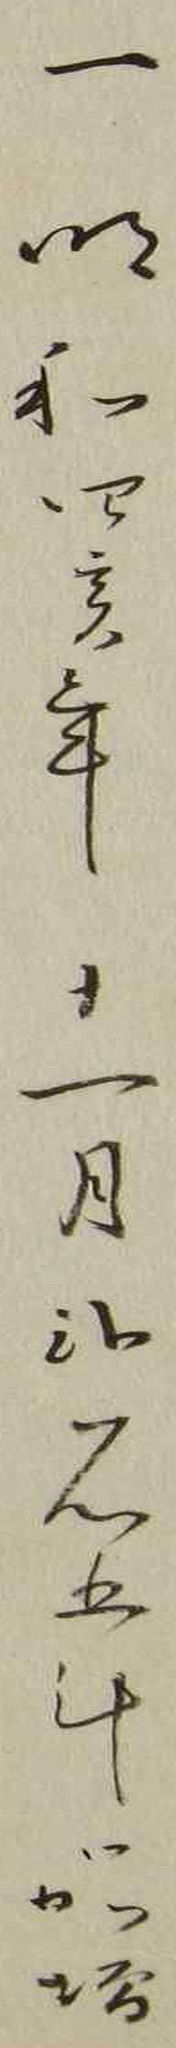一明和四亥年十一月弍石五斗御加増
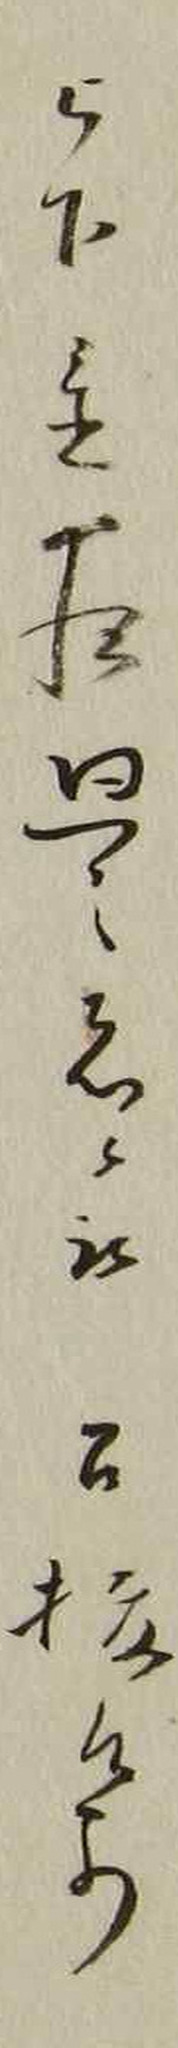被下置夜廻之者ニ被召抜候事
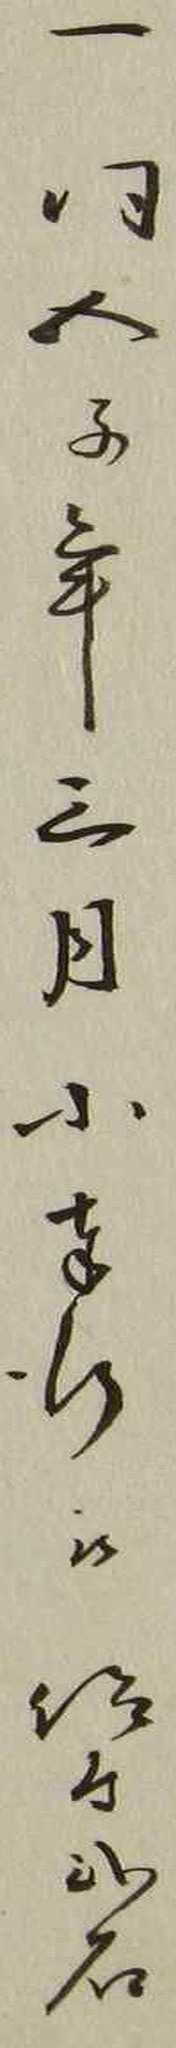一同五子年三月小奉行被仰付弍石
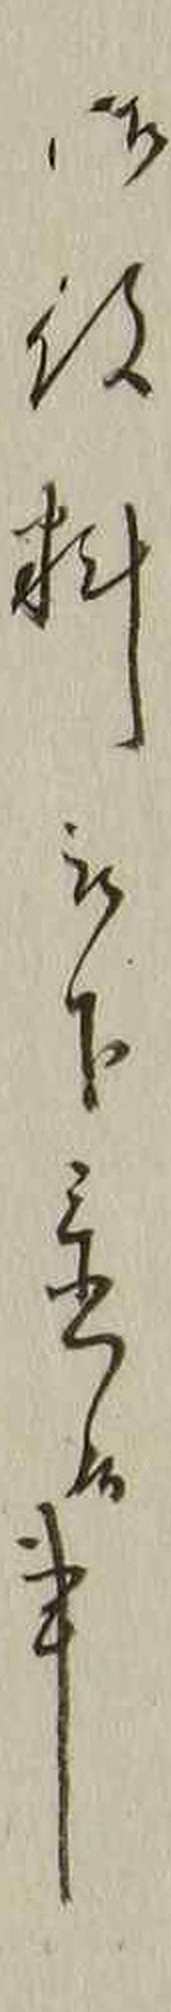御役料被下置候事
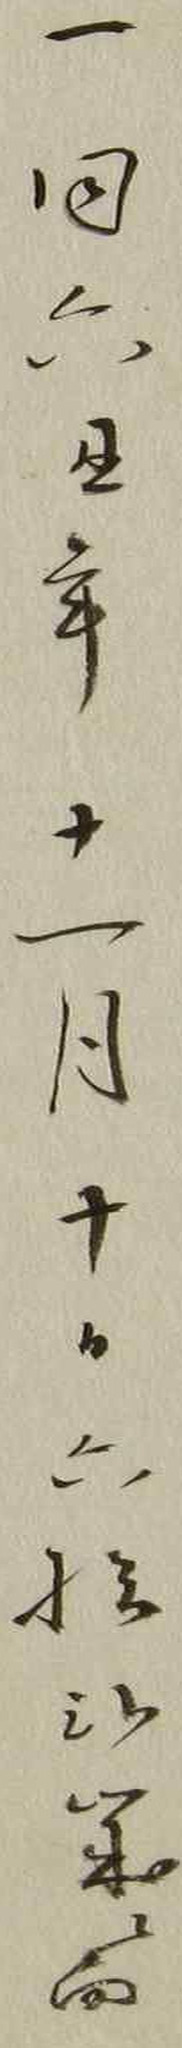一同六丑年十一月十日六拾弍歳ニ而
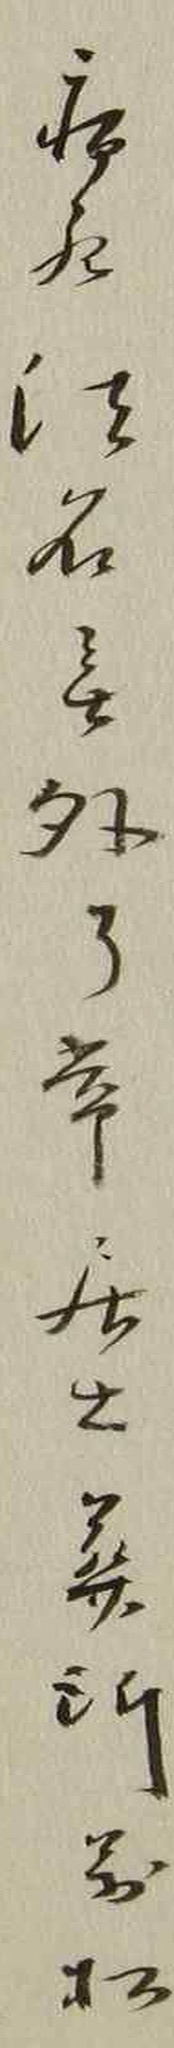病死法名春外了常居士葬所
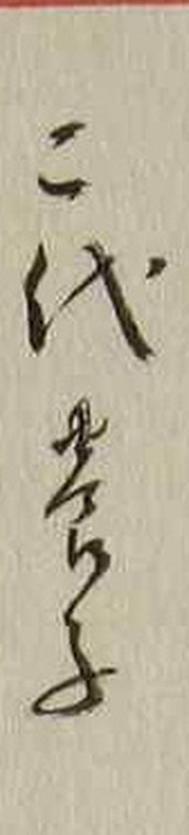二代養子
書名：諸士系譜　巻之8　い之部8
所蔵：会津若松市立会津図書館
